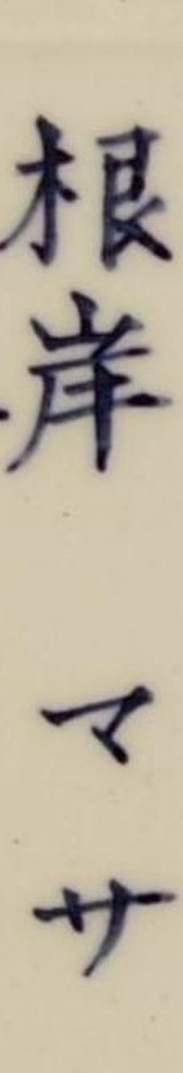根岸マサ
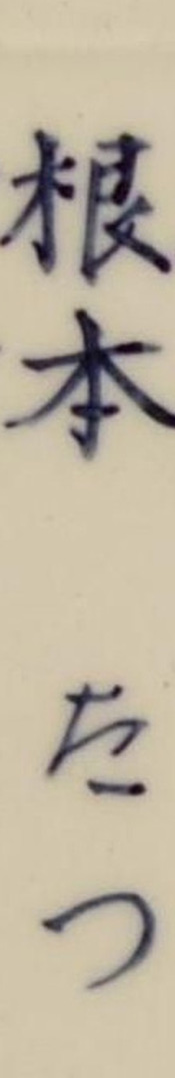根本たつ
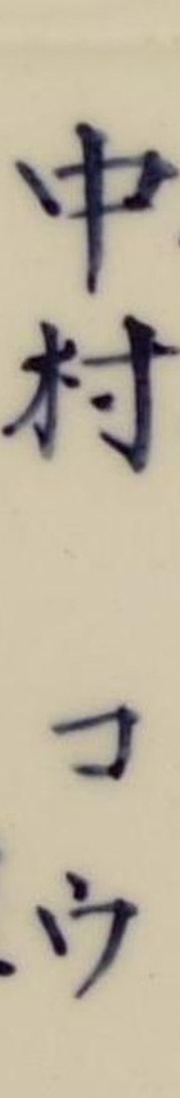中村コウ
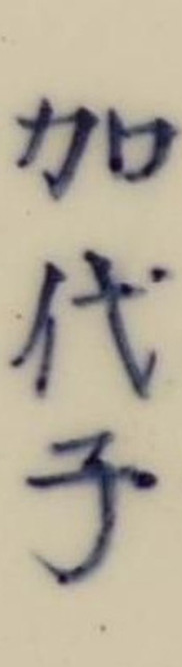加代子
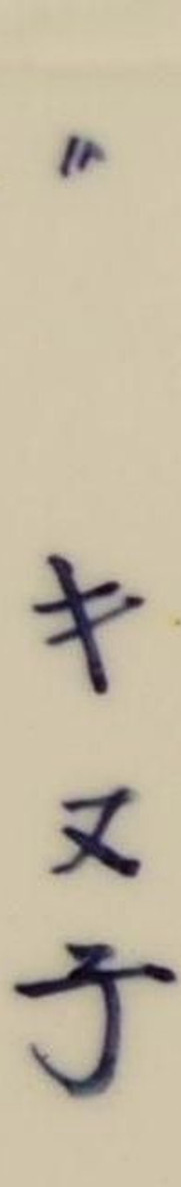キヌ子
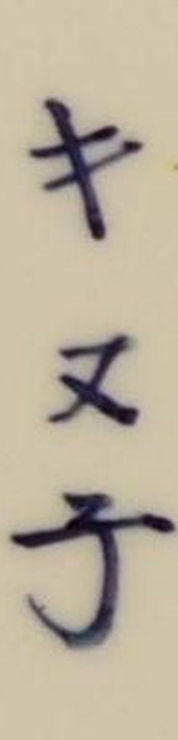キヌ子
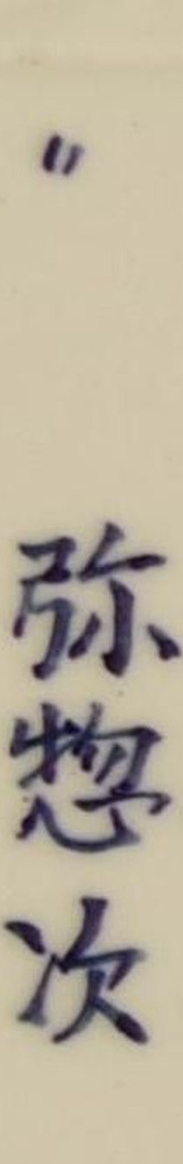弥惣次
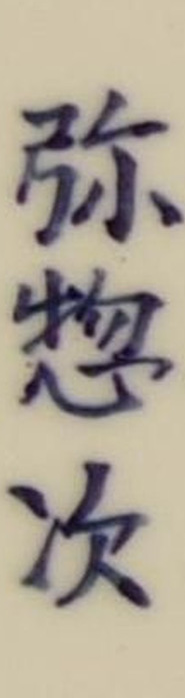弥惣次
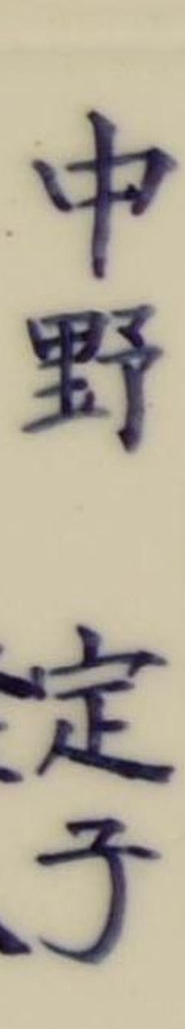中野定子
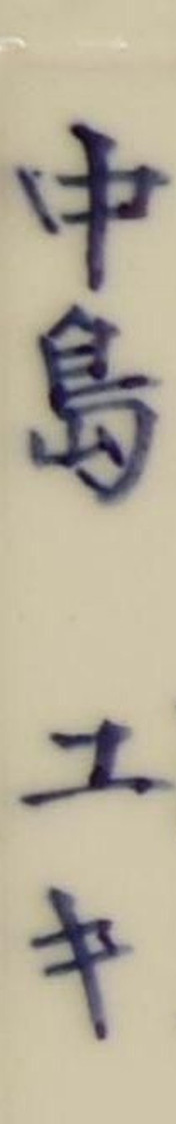中島ユキ

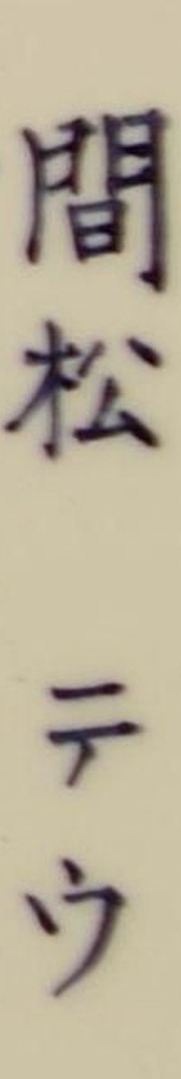間松テウ
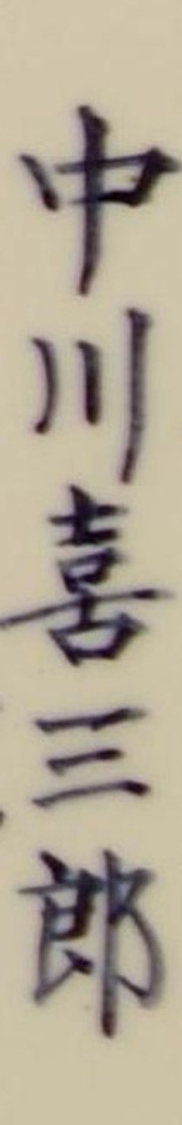中川喜三郎
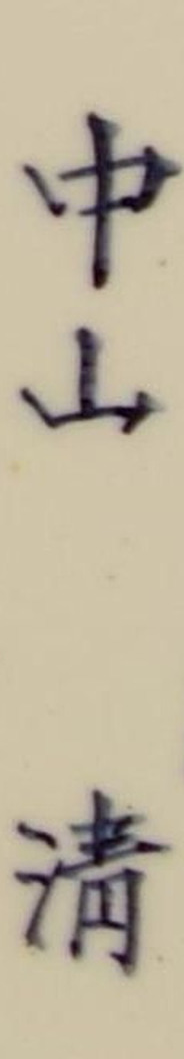中山清
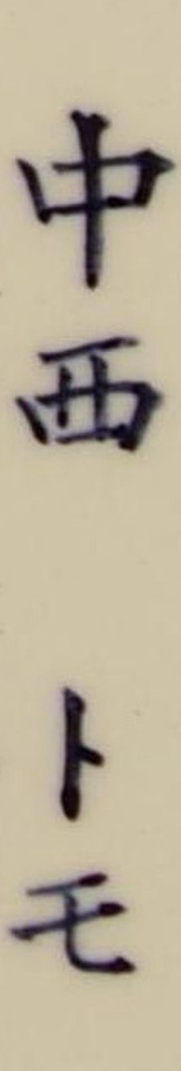中西トモ
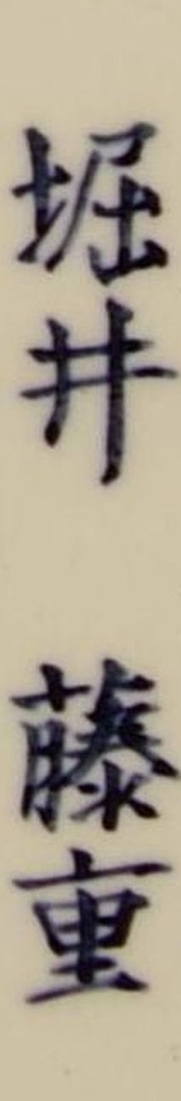堀井藤重
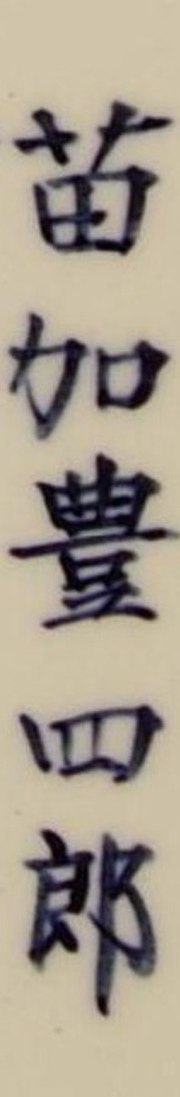苗加豊四郎
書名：E~L
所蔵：高野山金剛峯寺
